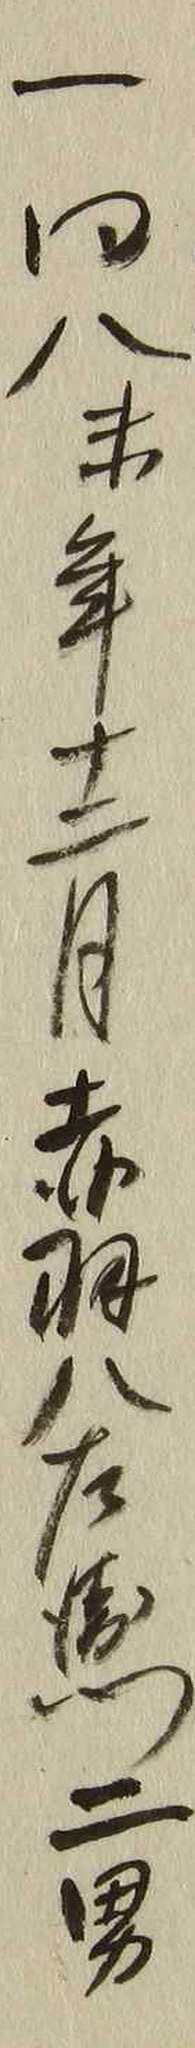一同八未年十二月赤羽八左衛門二男
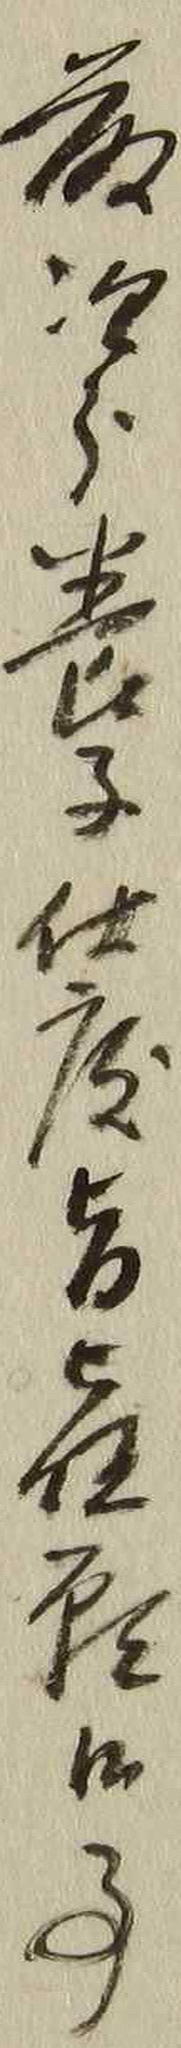藤次郎養子仕度旨被任願候事
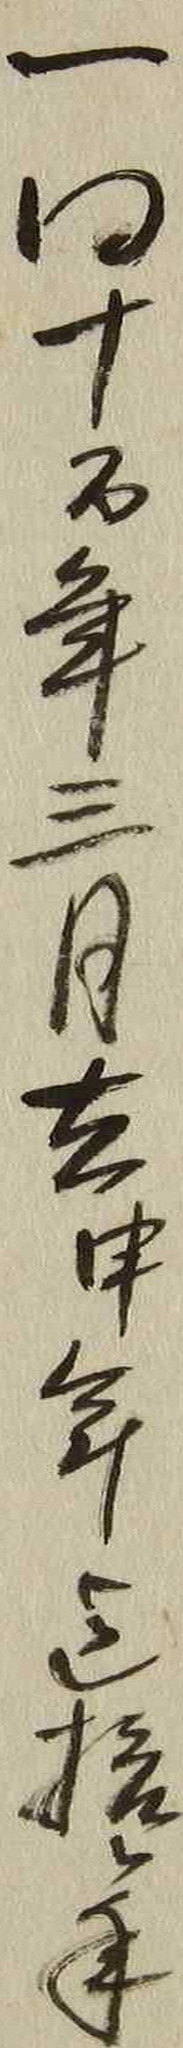一同十酉年三月去申年迄拾ケ年
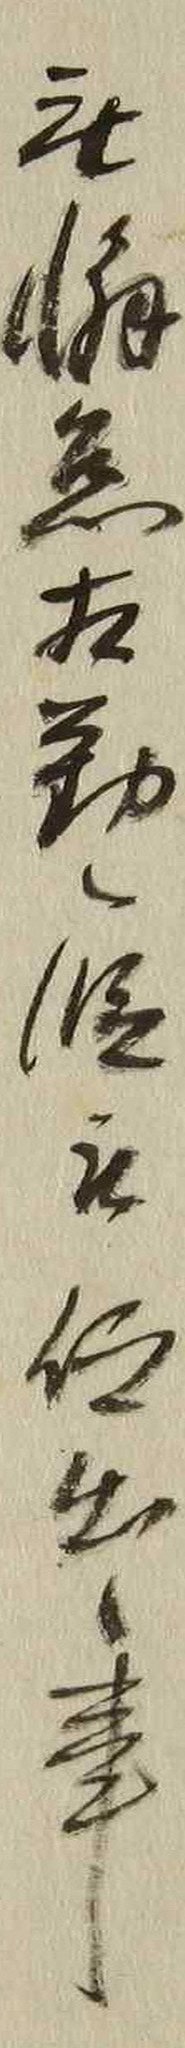無懈怠相勤候段仰出候事
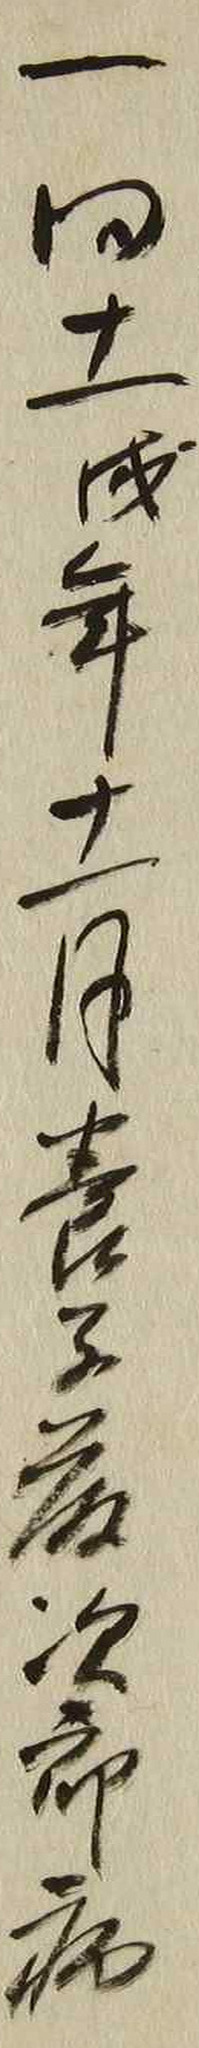一同十一戌年十一月養子藤次郎病
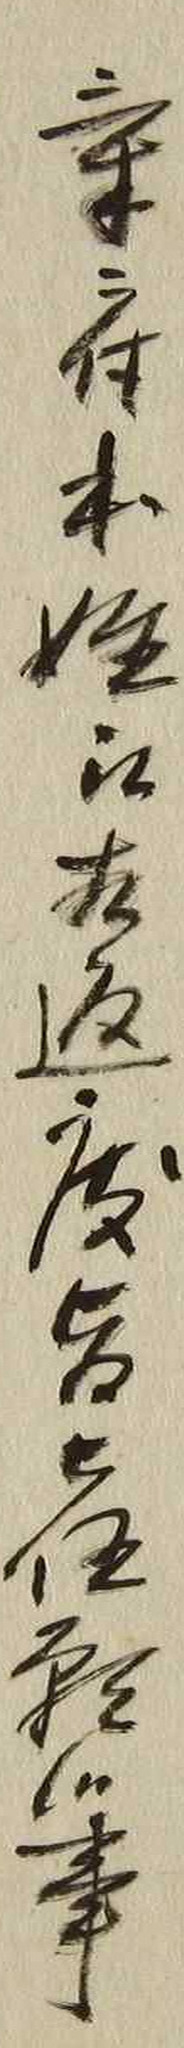気ニ付本姓江相返度旨被任願候事
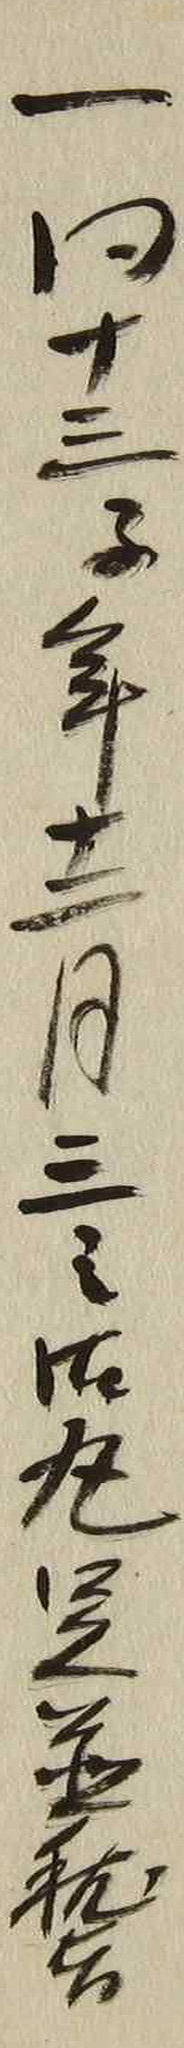一同十三子年十二月三之御丸足並稽
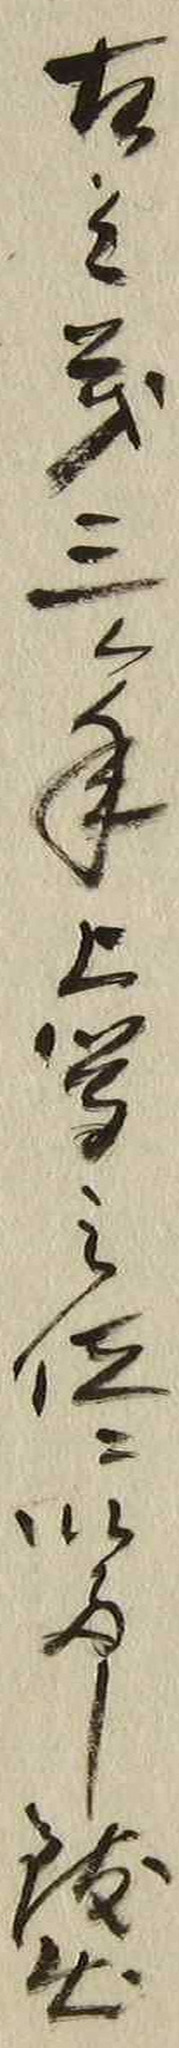古之義三ケ年上等之位ニいたし致出
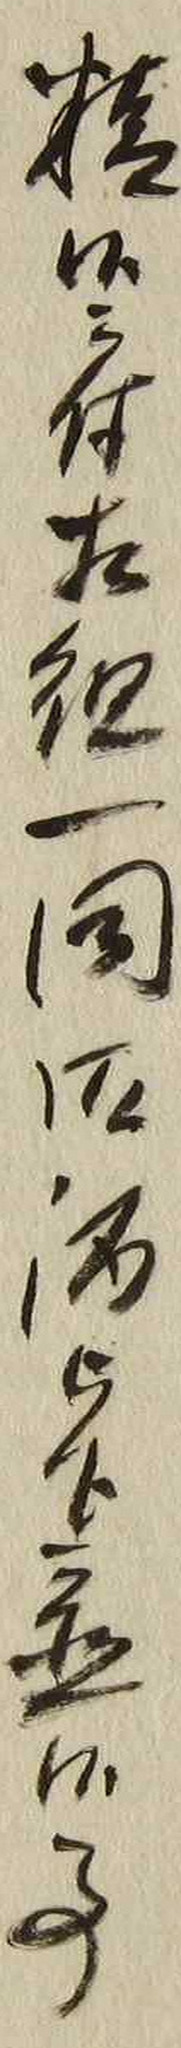精候ニ付相組一同御酒被下置候事
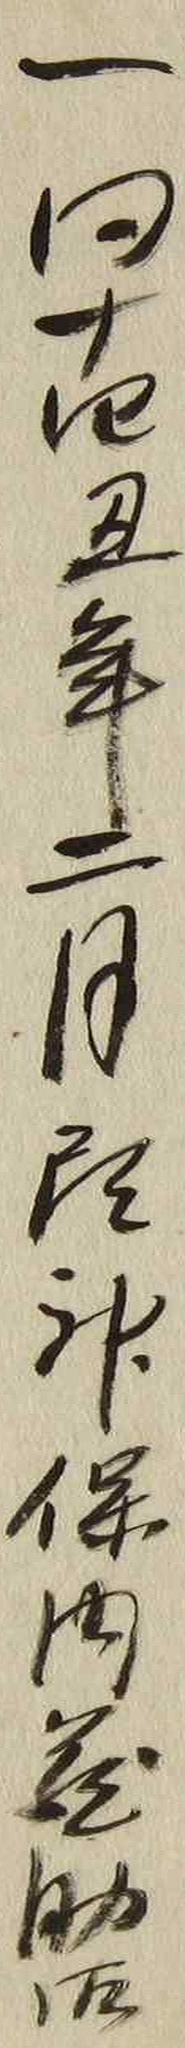一同十四丑年二月頭神保内蔵助御
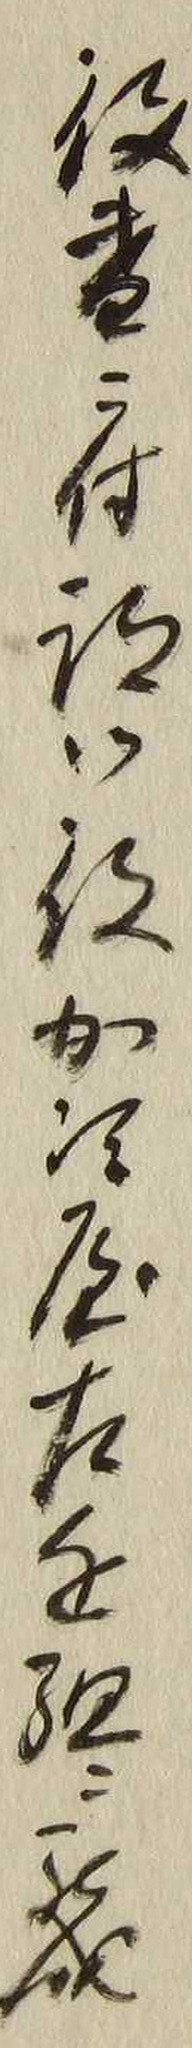役替ニ付跡御役加須屋左近組ニ罷成
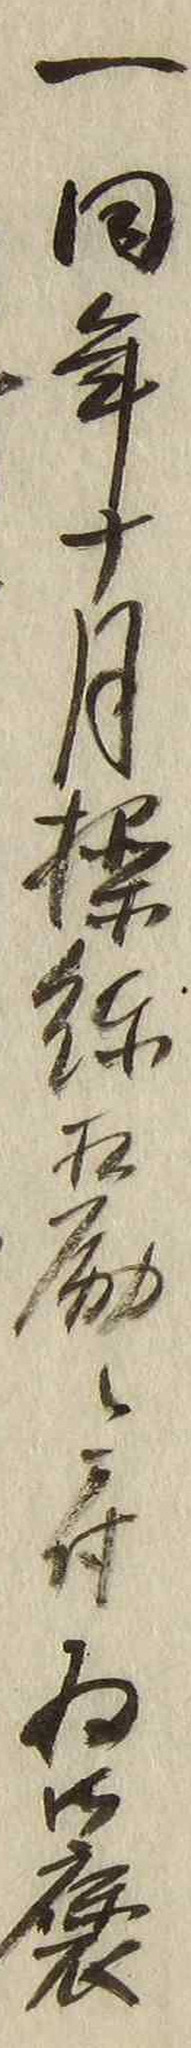一同年十月操練相励候ニ付為御褒
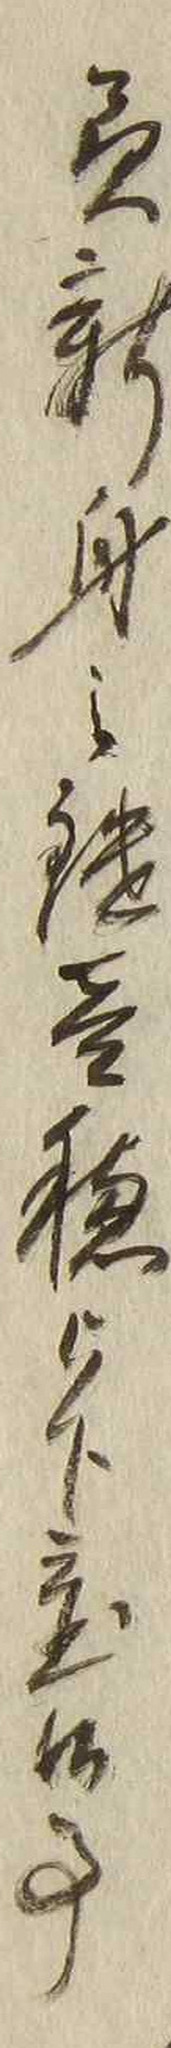美新身之鑓壱穂被下置候事

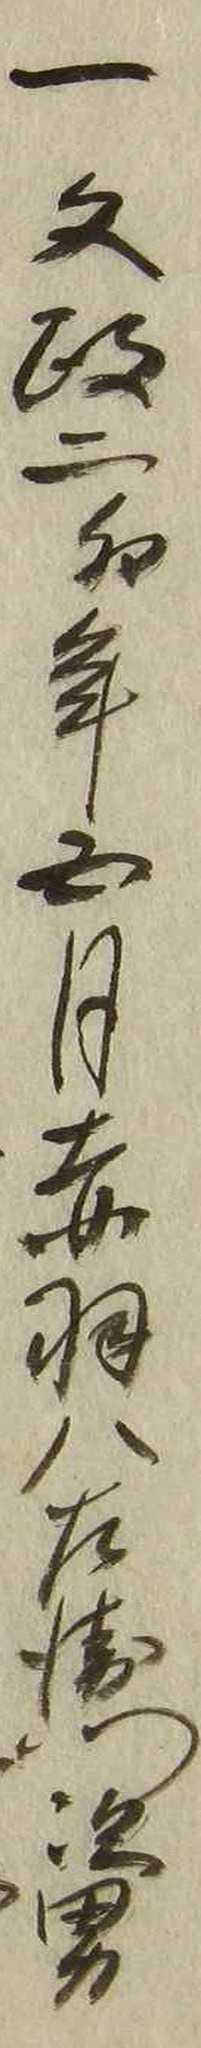一文政二卯年五月赤羽八左衛門次男
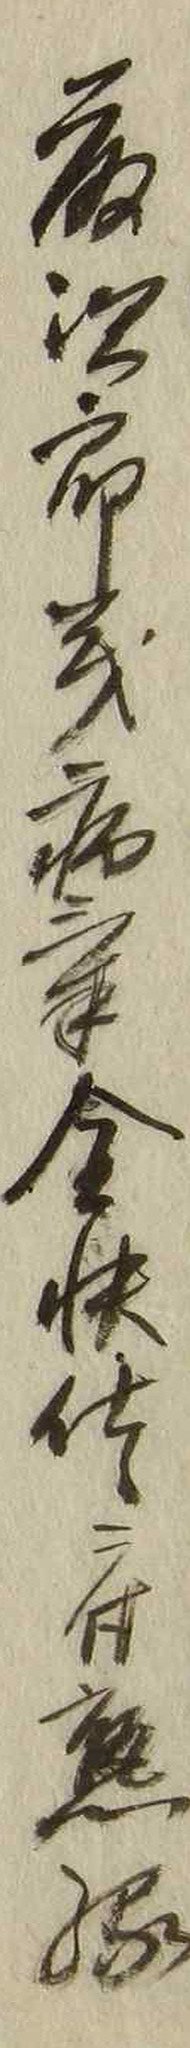藤次郎義病気全快仕候ニ付熟縁
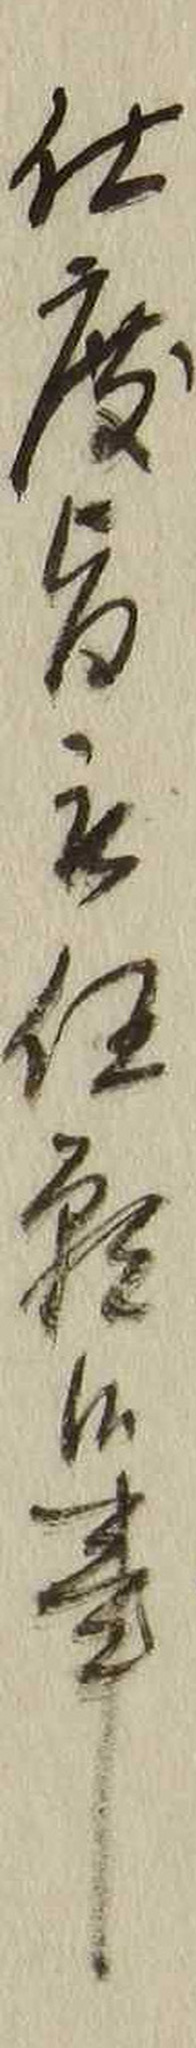仕度旨被任願候事
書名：諸士系譜　巻之359　す之部9
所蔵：会津若松市立会津図書館
